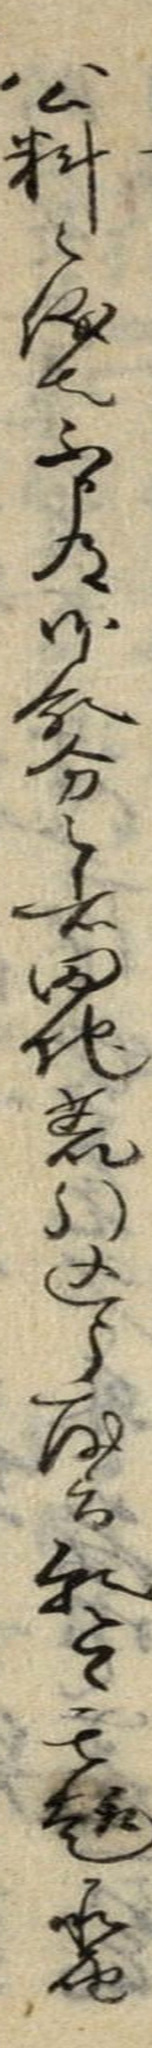一公料之儀は不申及御領分之者田地荒引込申度旨願候はゝ其趣承届
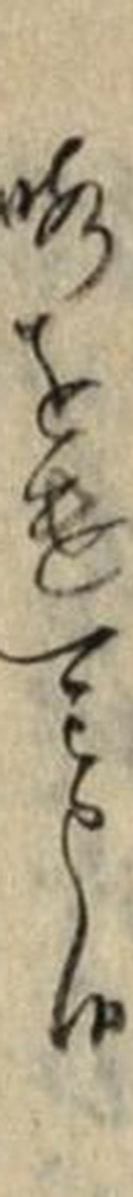暇を遣可被申候
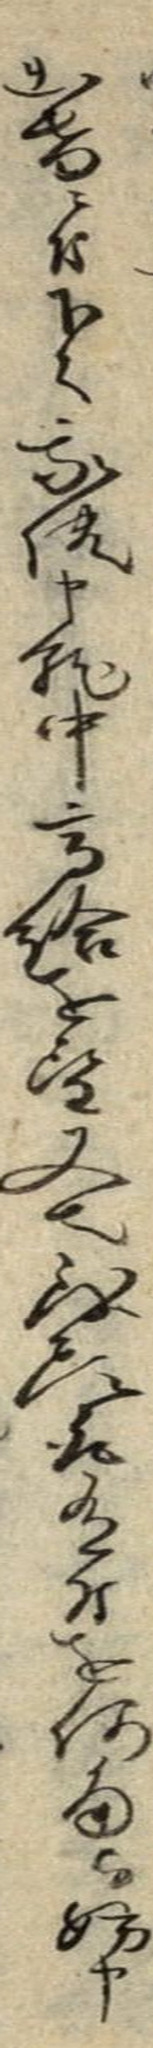一出替に付下々我儘申就中高給を望又は致頭取有付を何角と妨申
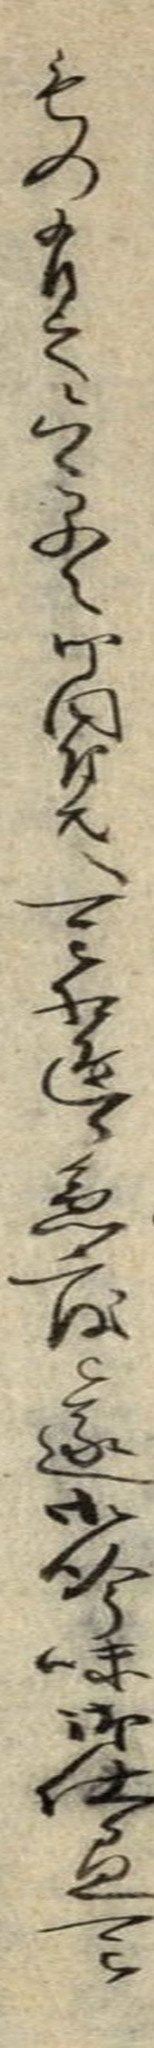者有之候はゝ早々御目付共へ可被相達候急度被遂御吟味御仕置可被
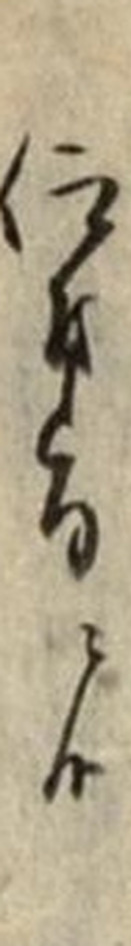仰付旨に候
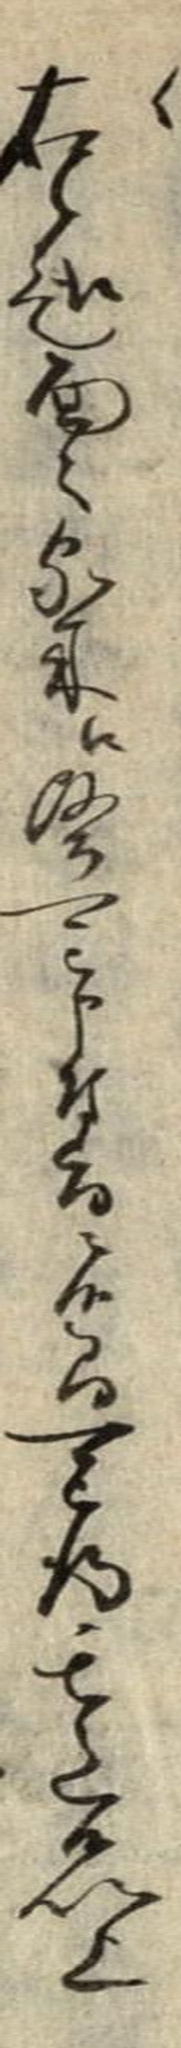右之趣面々家来江堅可被申付旨に候間可被為得其意候以上
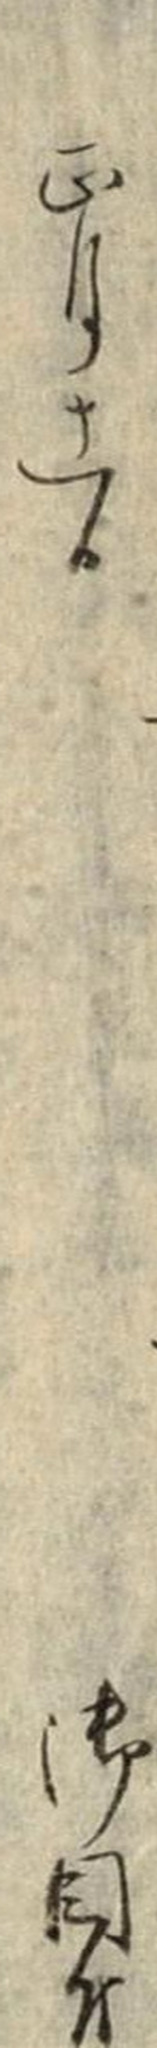正月十一日御目付
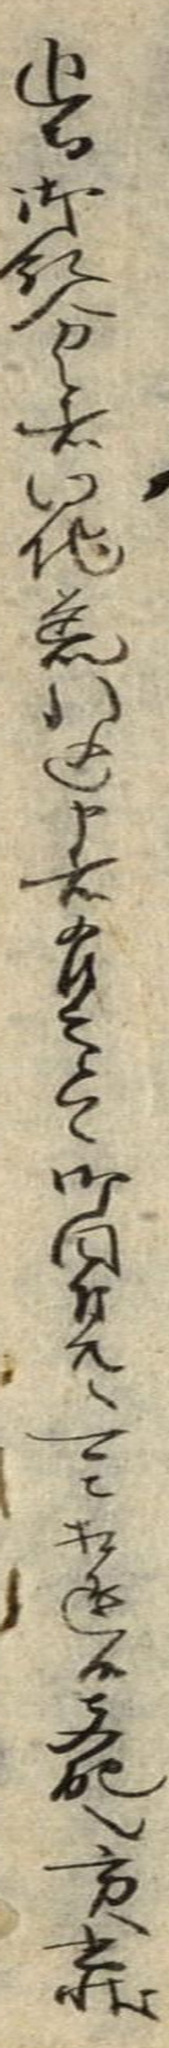追て御領分之者田地荒引込申者有之候はゝ御目付共へ可被相達候支配之方へ書状
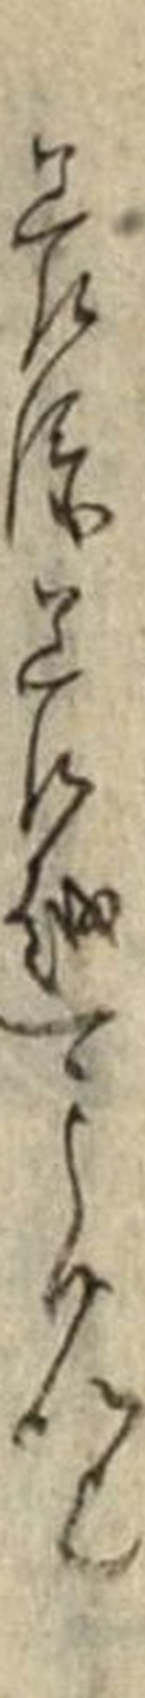差添差越可申候以上
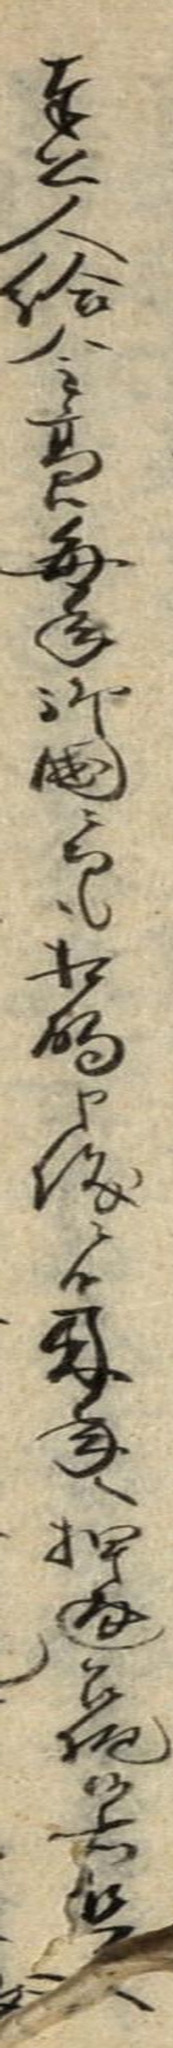一奉公人給金高は毎年御国にても相触申儀に候来年へ押通召抱候者
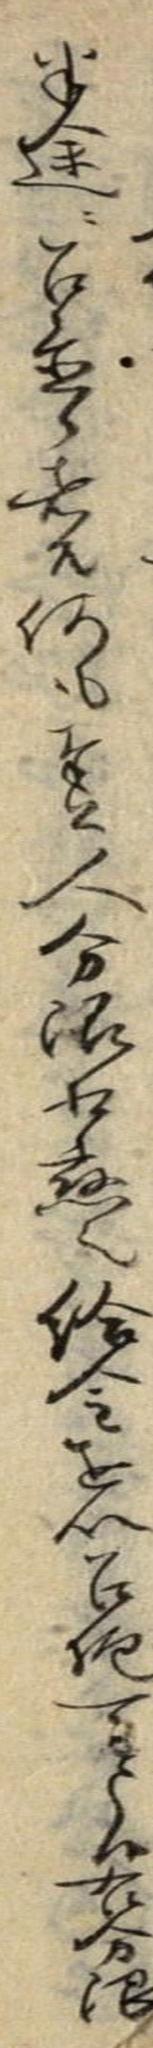半途に召置候者共何も奉公人分限相応之給金を以召抱可被申候右分限

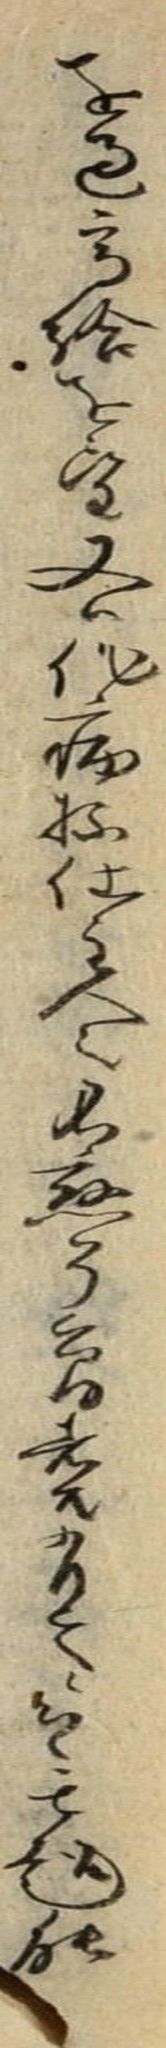を過高給を望又は作病抔仕主人之不応了簡者共有之候はゝ其趣能
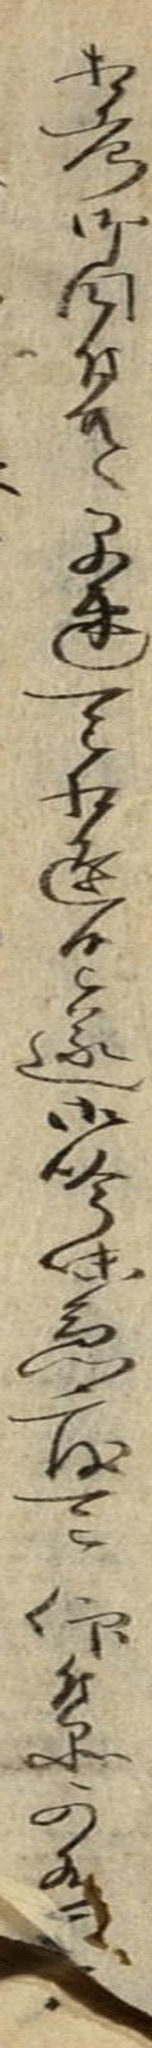相考御目付共へ早速可被相達候被遂御吟味急度可被仰付品可有
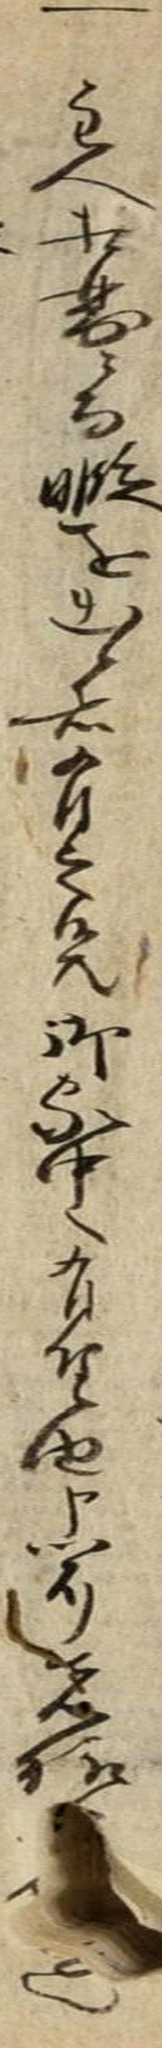一主人相対にて暇を出候者有之候共御家中へ有付候由申聞怎様
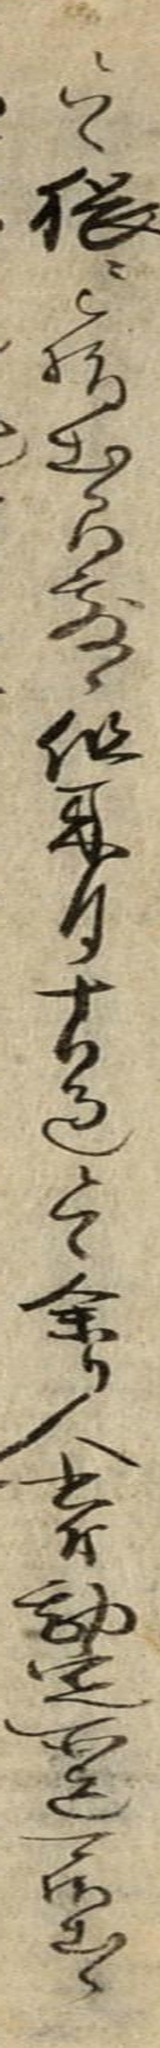候はゝ猥に被指出間敷候但来月十日過候はゝ余り人書付勘定所迄可指出候
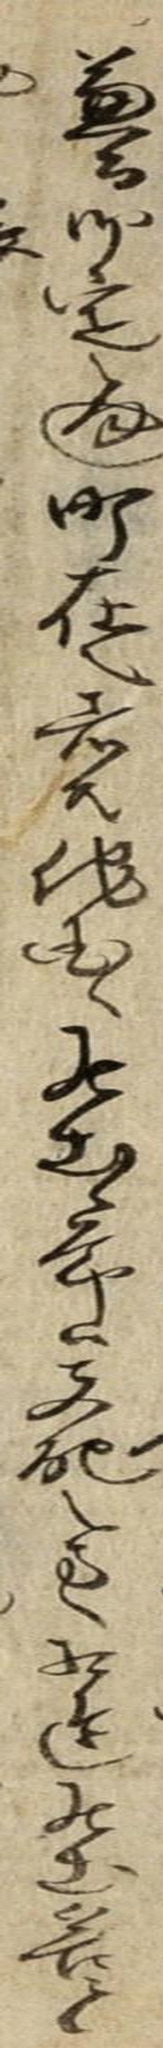一兼て御定之通町在之者共他国へ罷出候節は支配之方へ相達罷出筈に候
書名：三都并道中之部
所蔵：福井県文書館 Fukui Prefectural Archives
